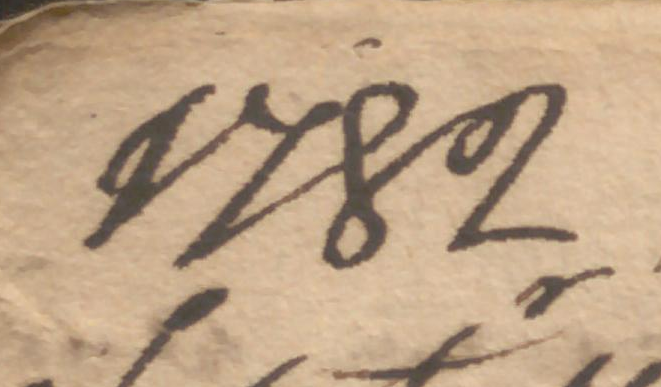1782
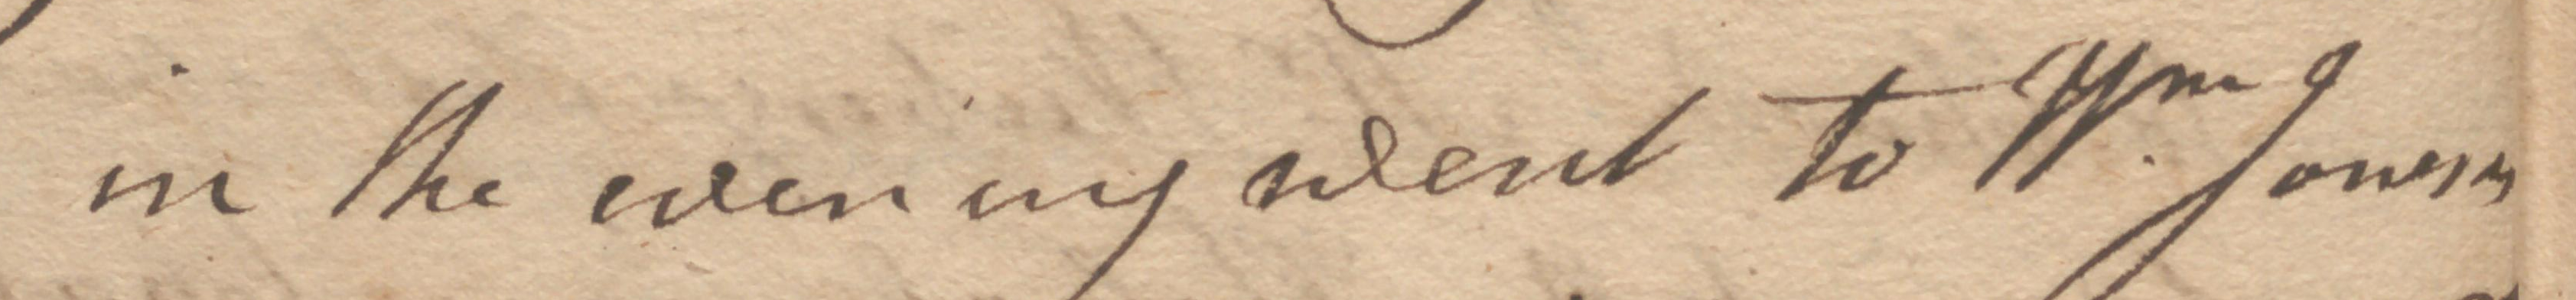in the evening went to W^m. Joneses
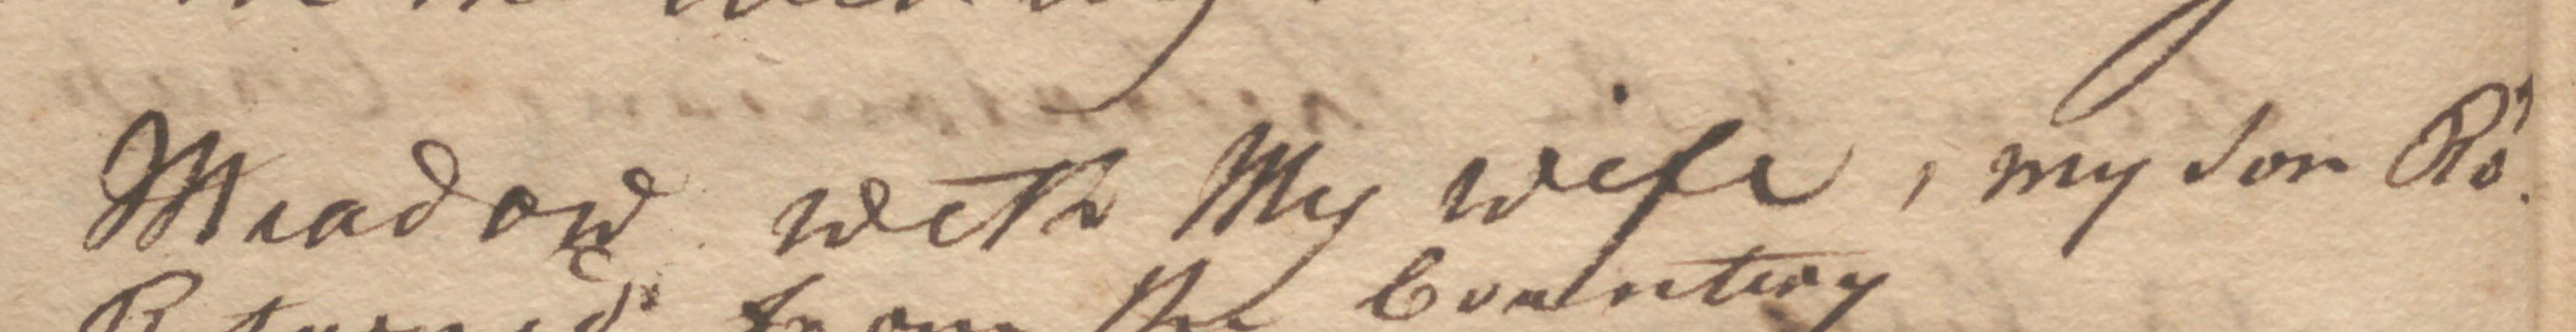Meadow with My wife, my son Ro^t
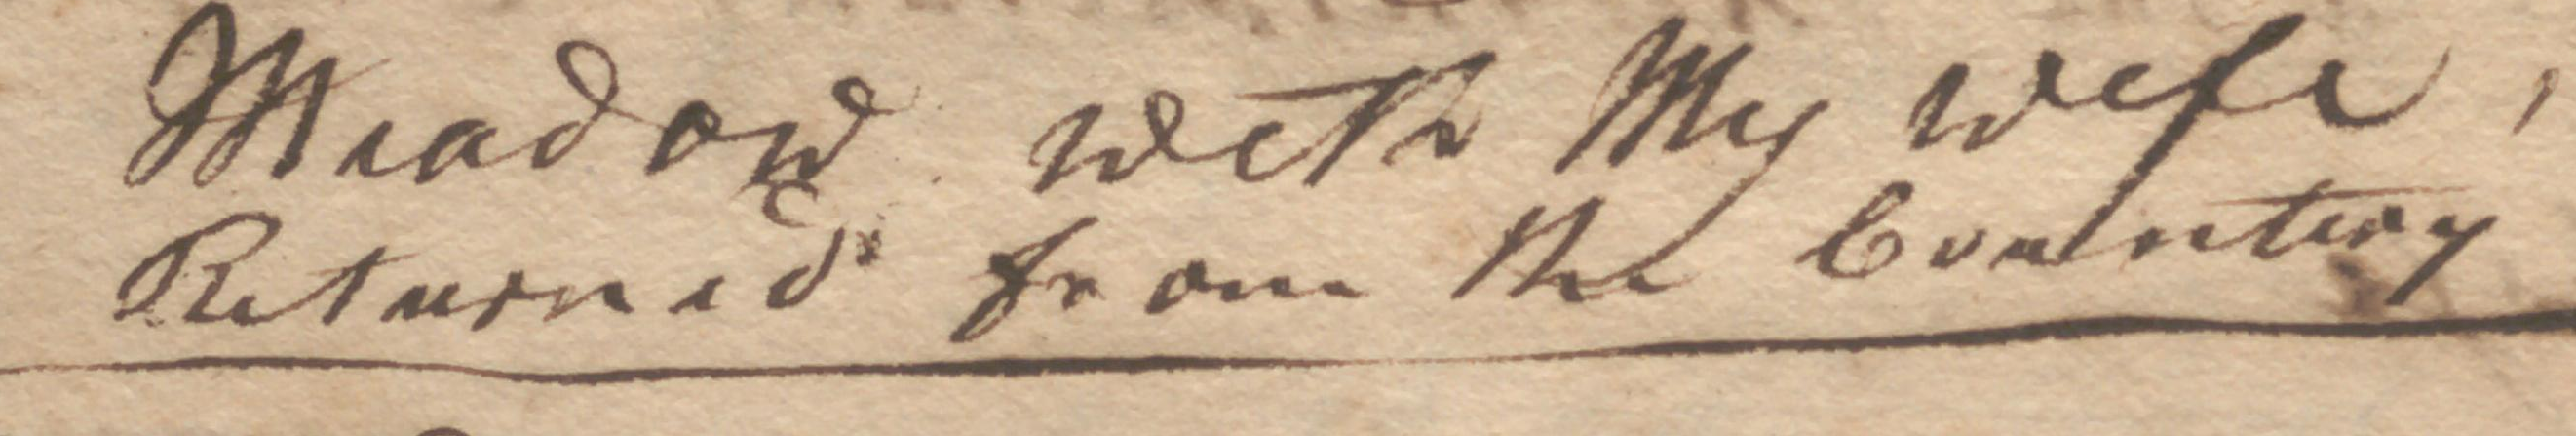Returned from the Countery
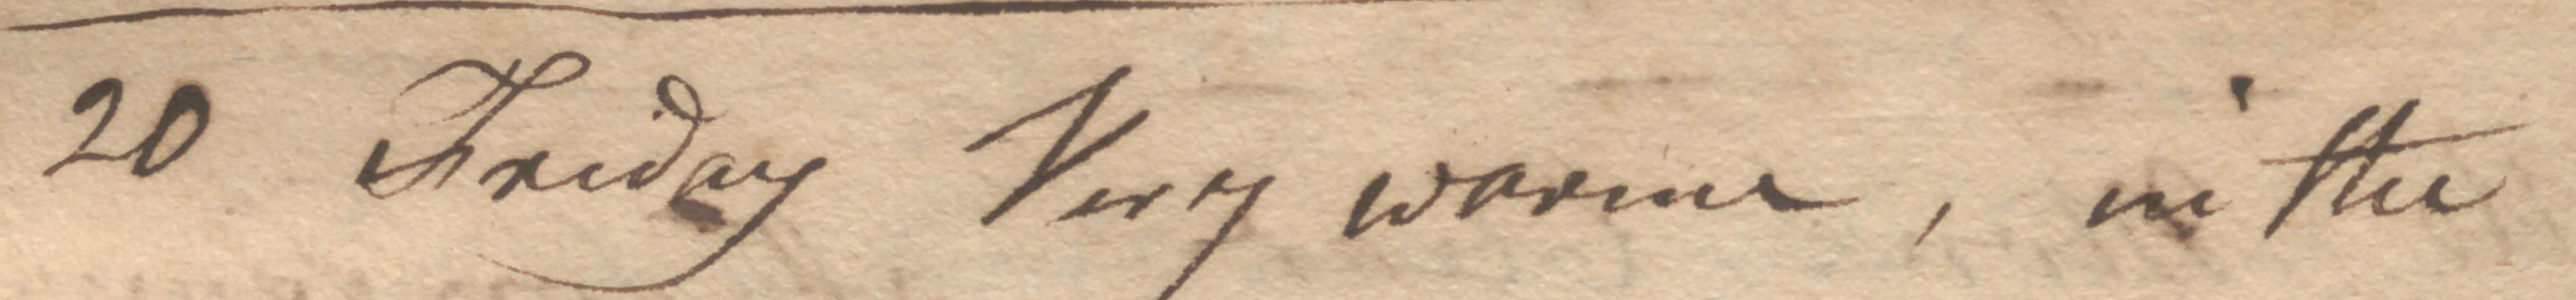20 Friday Very warme, in the
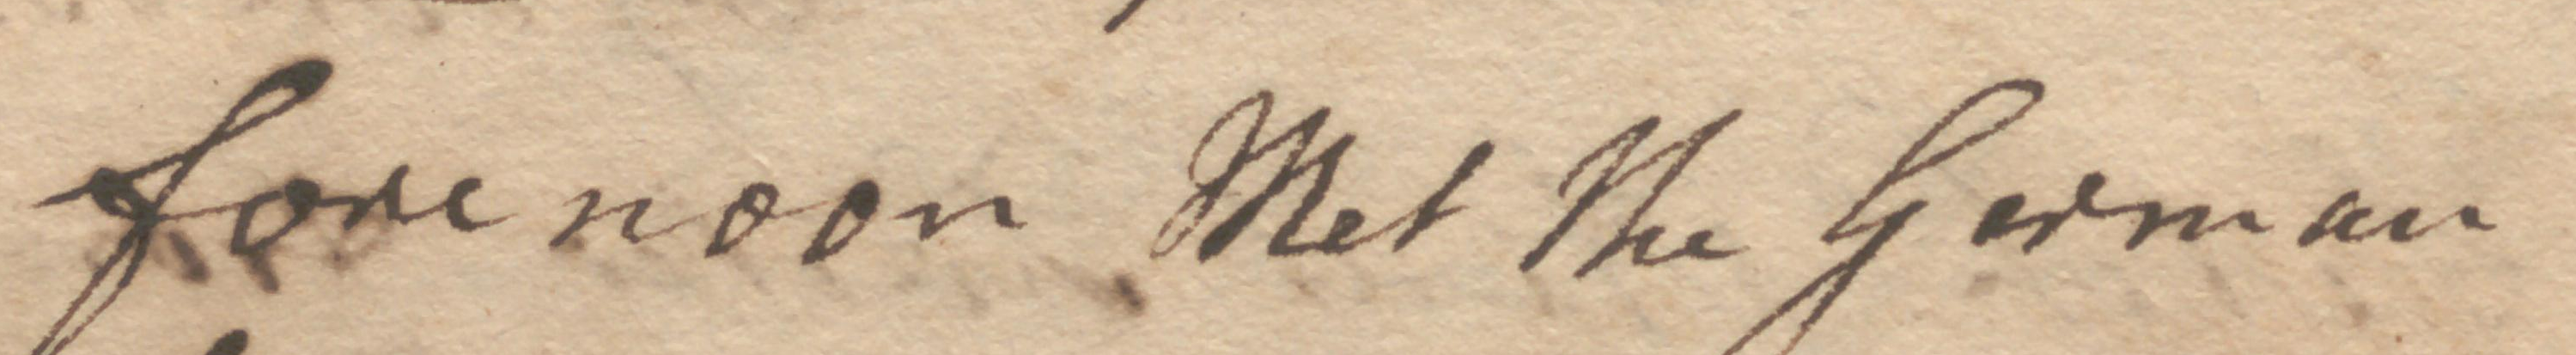forenoon Met the German
